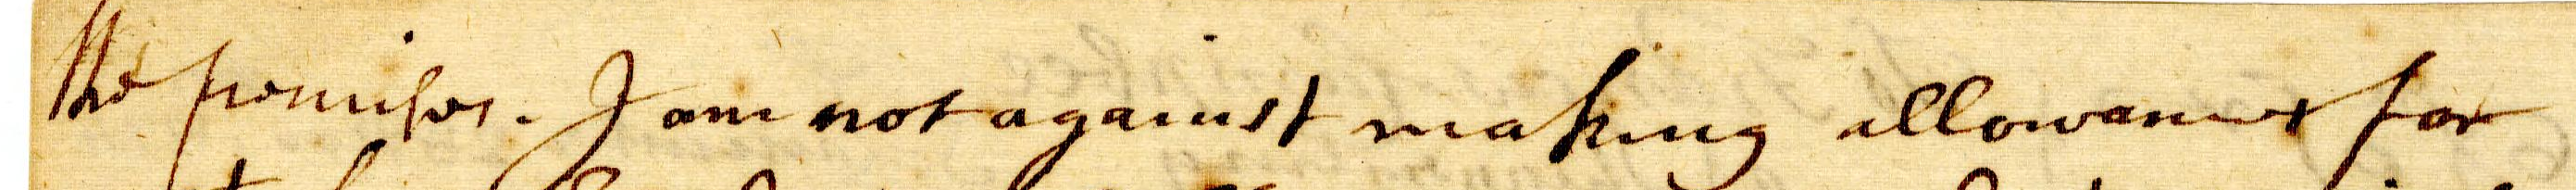the premises. I am not against making allowances for
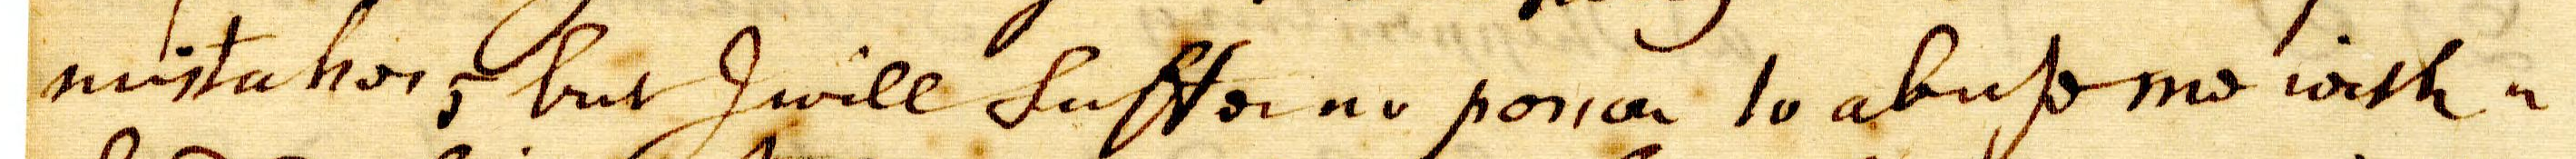mistakes, but I will Suffer no person to abuse me with
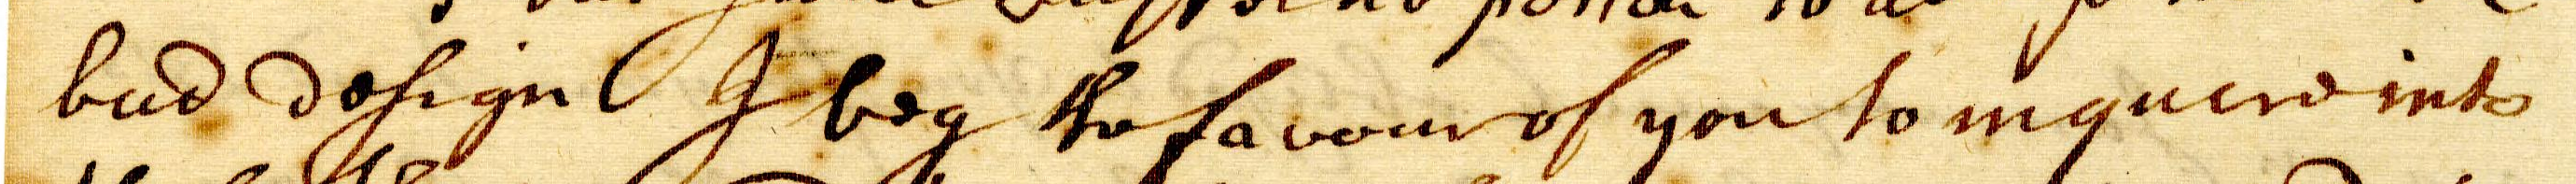bud design & beg the favour of you to inquire into
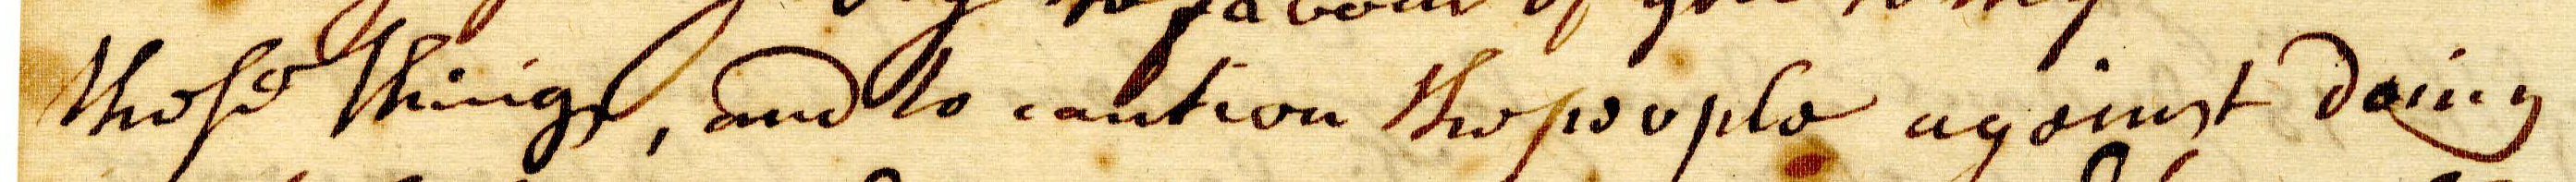these things, and to caution the people against doing
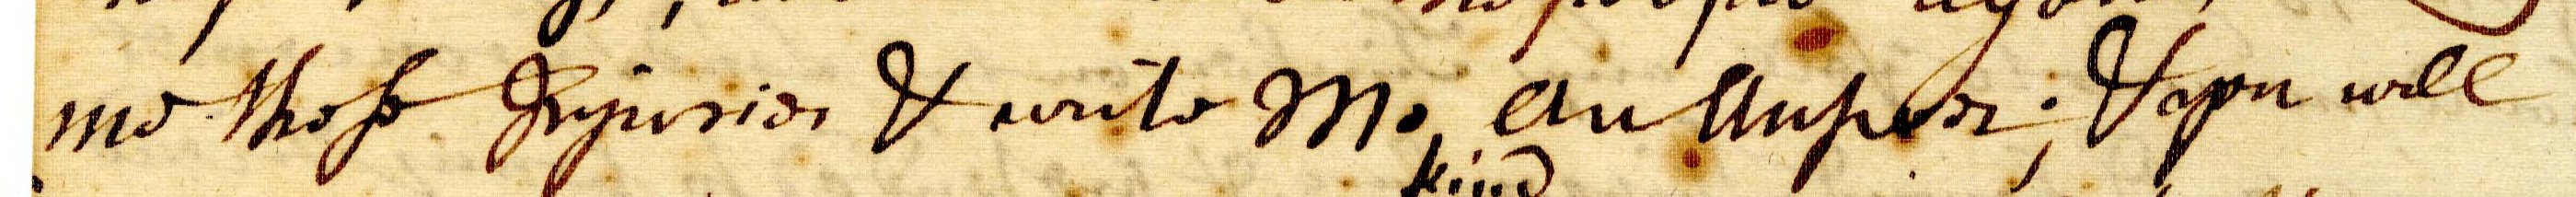me those Inquiries & write Me, An Answer. & you will
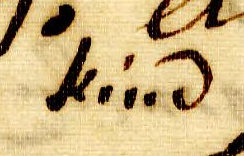kind
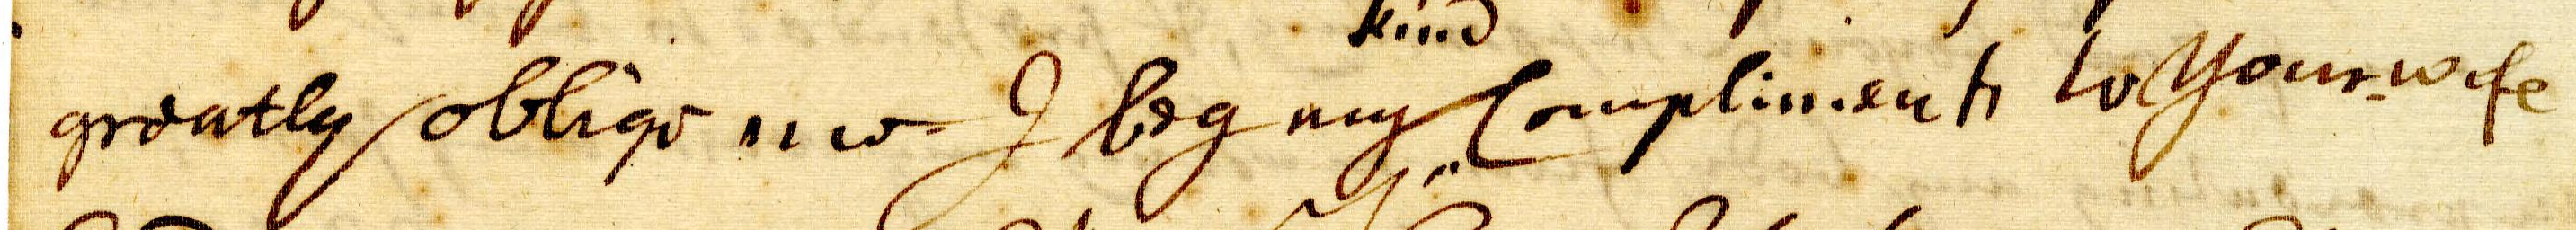greatly oblige me. I beg my Compliments Your Wife
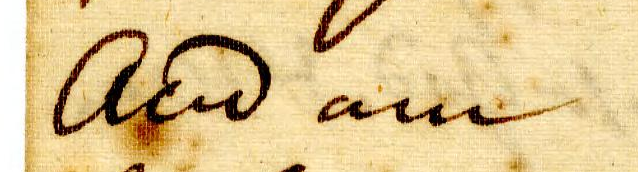And am
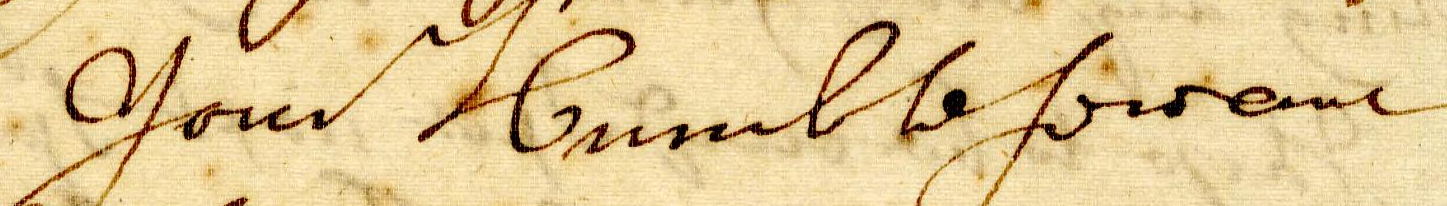Your Humble Servant
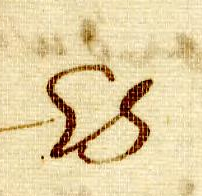ES
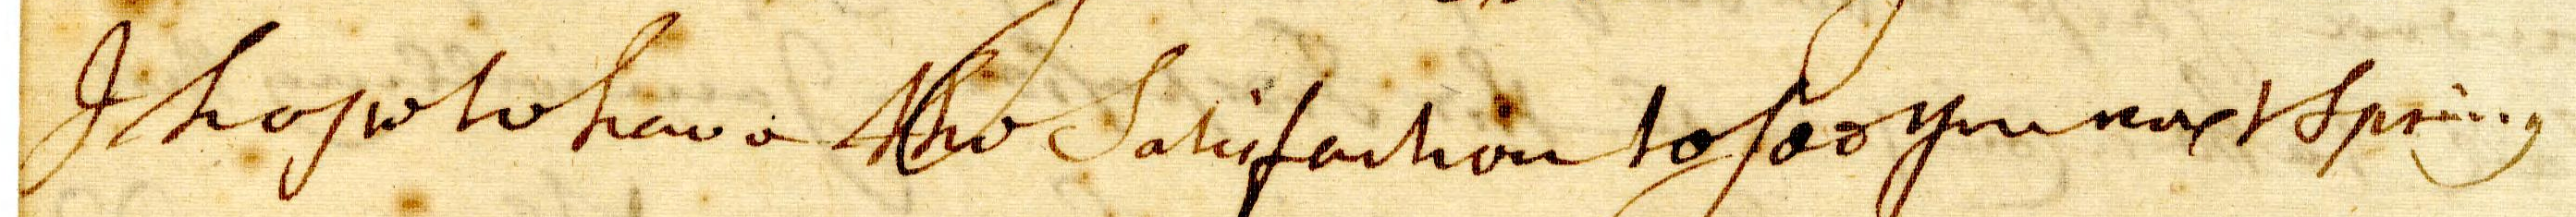I hope to have the Satisfaction to see you next Spring
